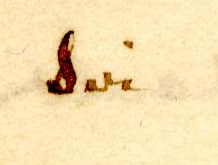Sir
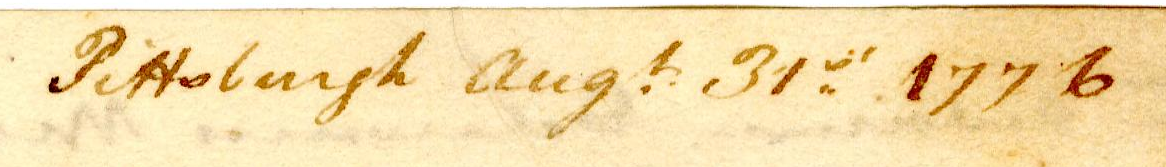Pittsburgh Aug^t. 31^st. 1776
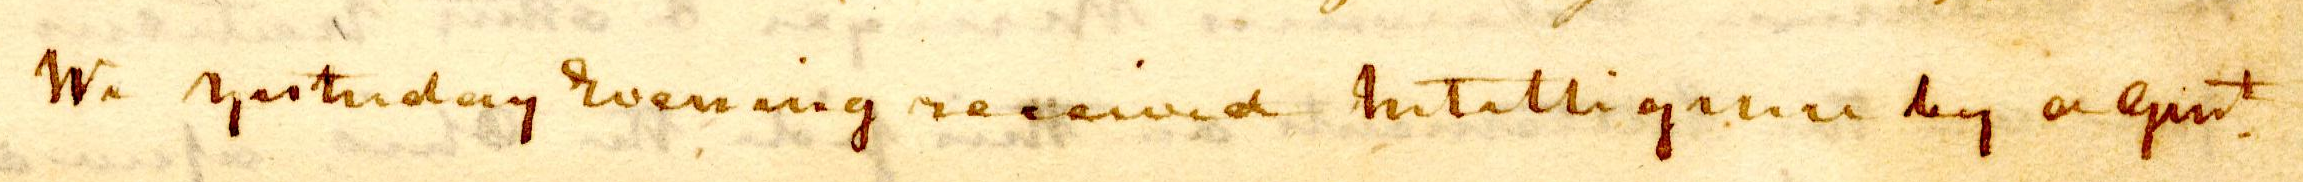We yesterday Evening received Intelligence by a Gen^t.
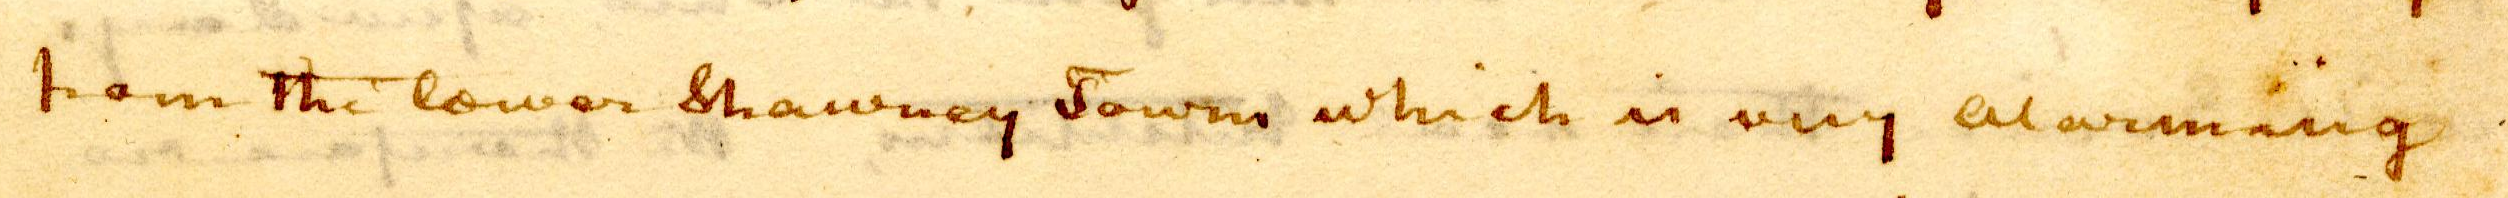from the lower Shawney Town which is very alarming
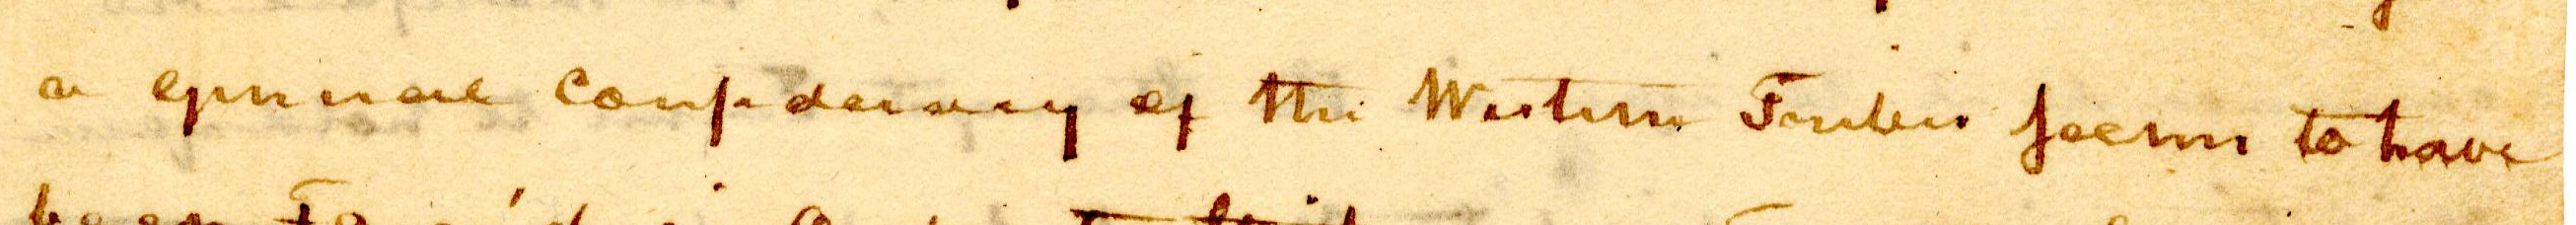a general Confederacy of the Western Tribes seem to have
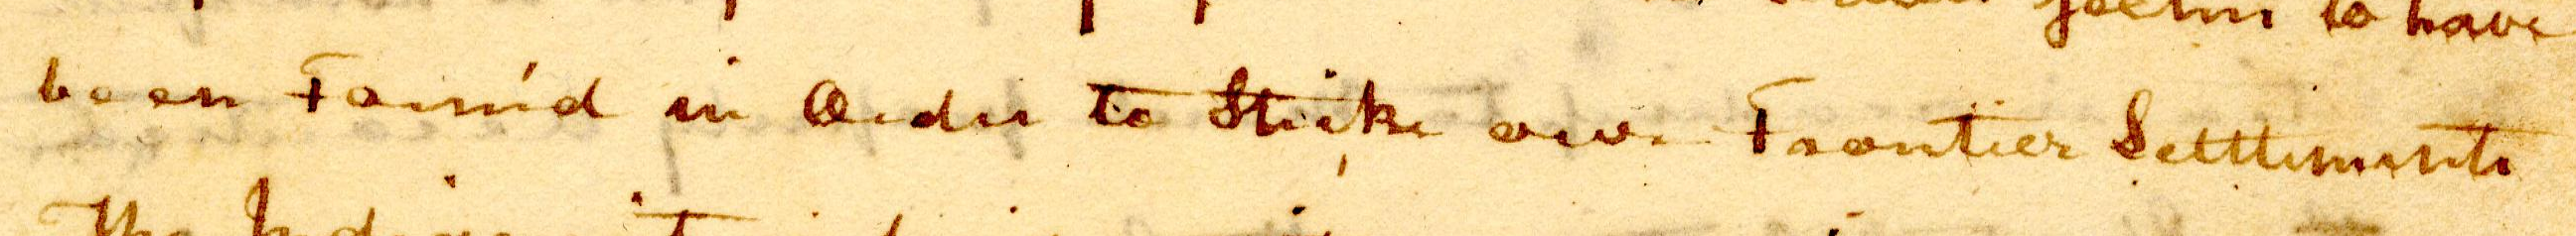been tam'd in Order to Strike our Frontier Settlements
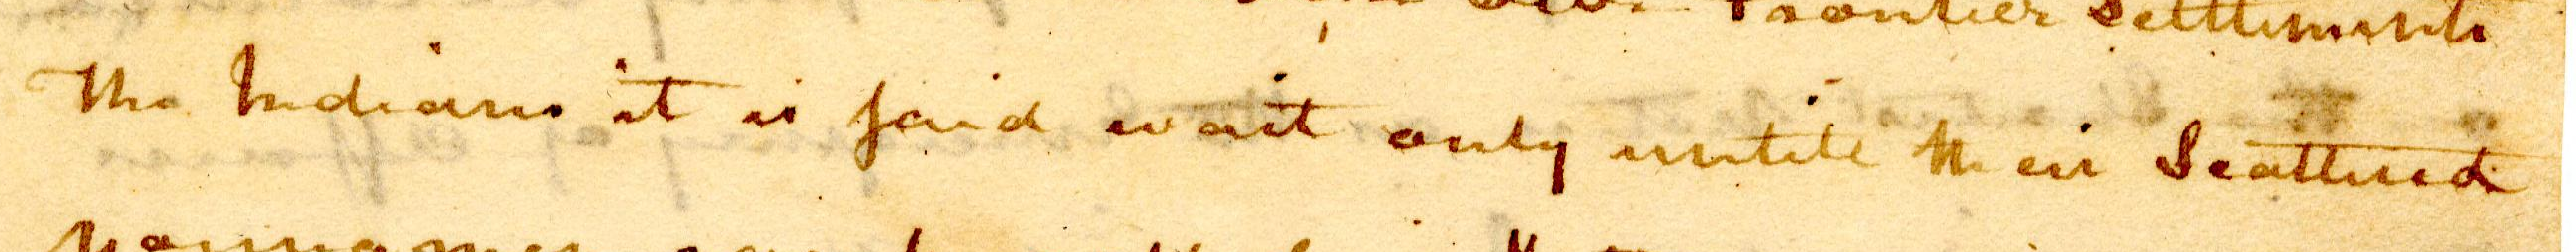The Indians it is said wait only untill their feattered
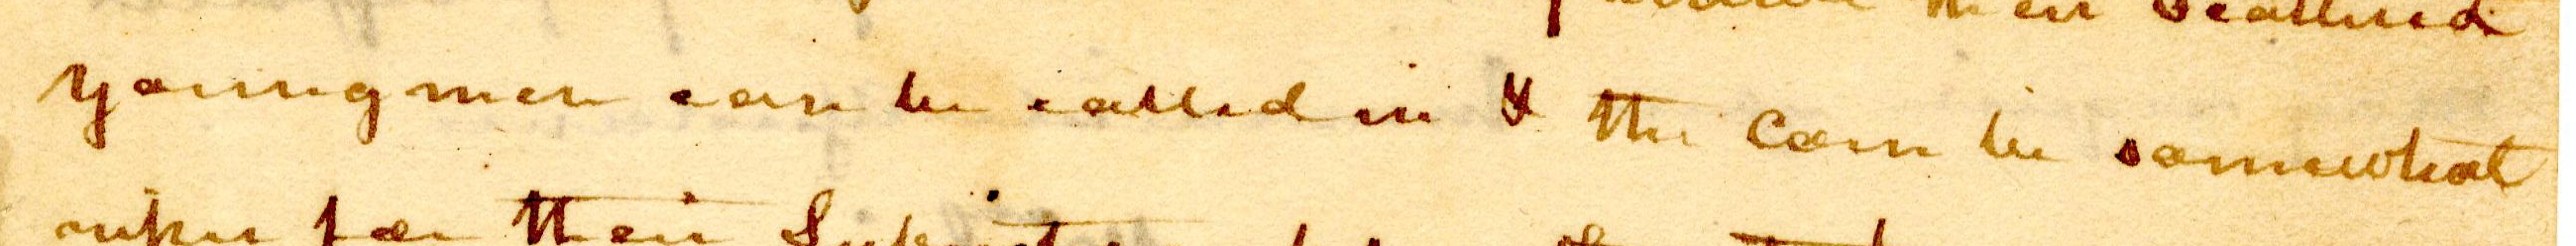young men can be called in & the Corn be somewhat
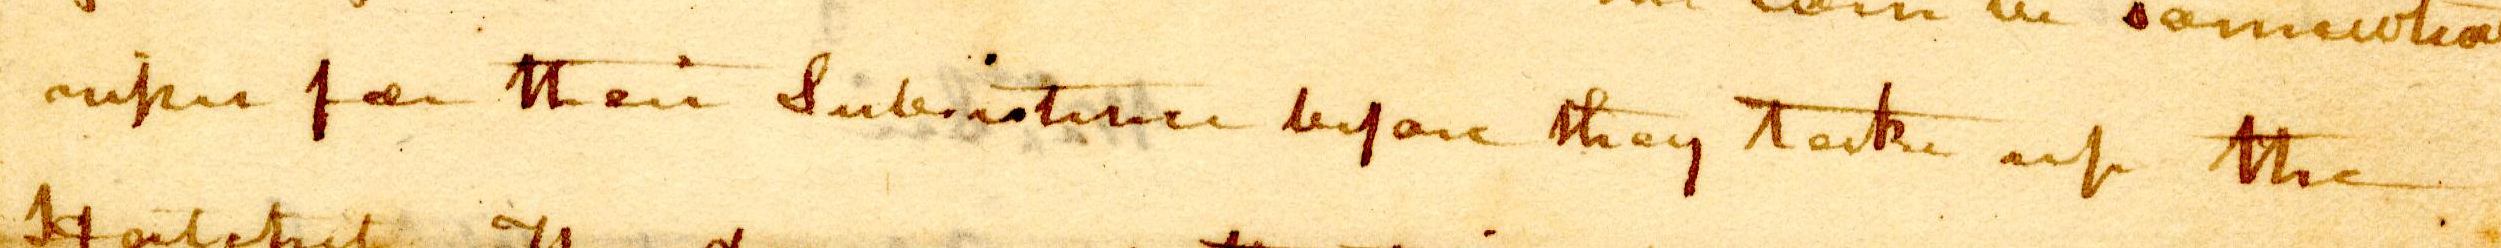riper for their Subsistence before they take up the
